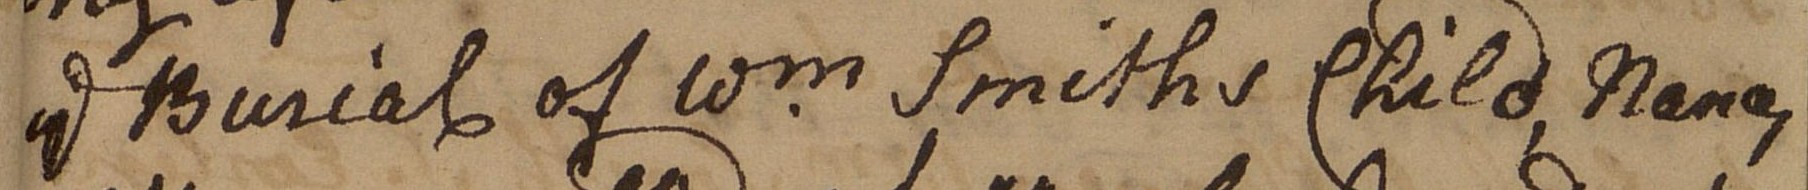y^e Burial of W^m. Smiths Child, Nancy
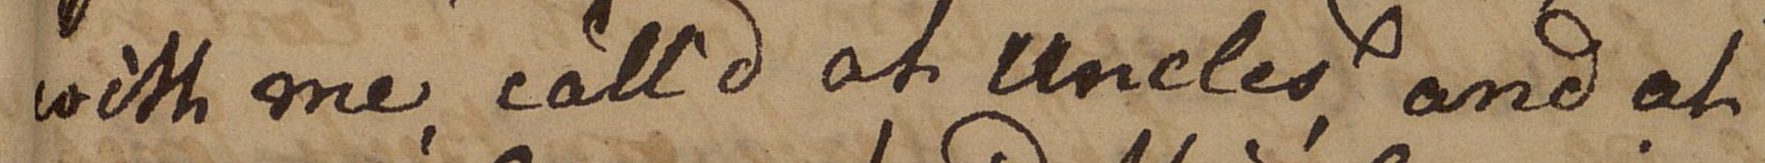with me, call'd at Uncles, and at
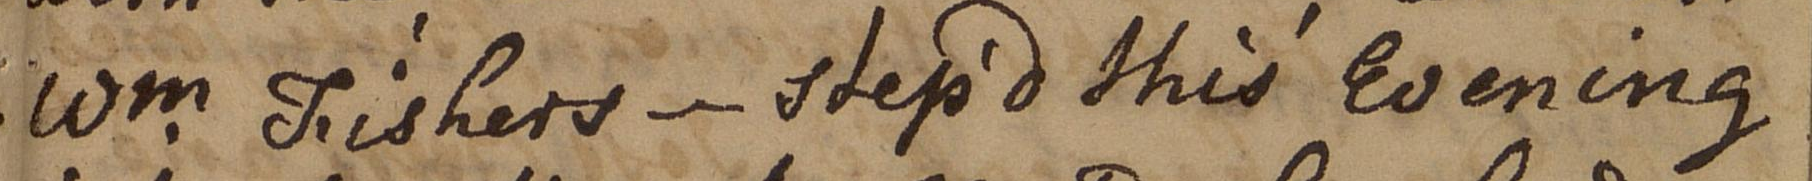W^m. Fishers- step'd this Evening
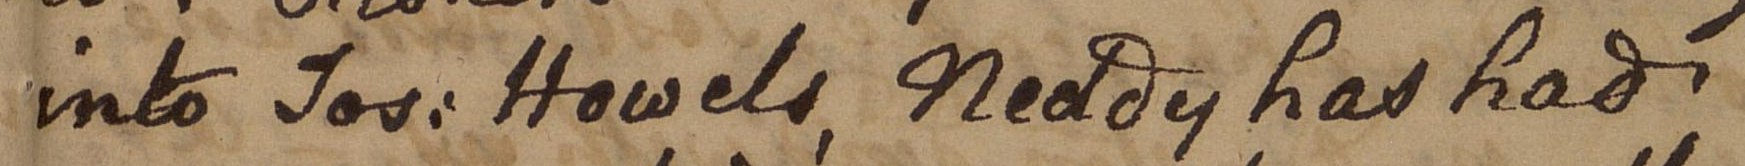into Jos: Howels, Neddy has had
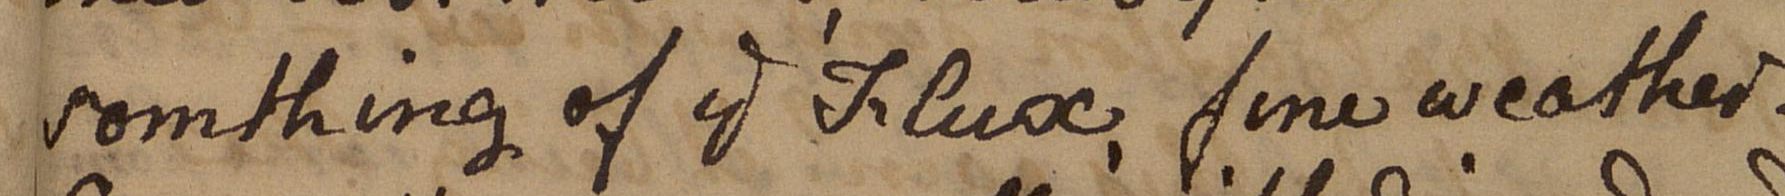somthing of y^e Flux, fine weather-
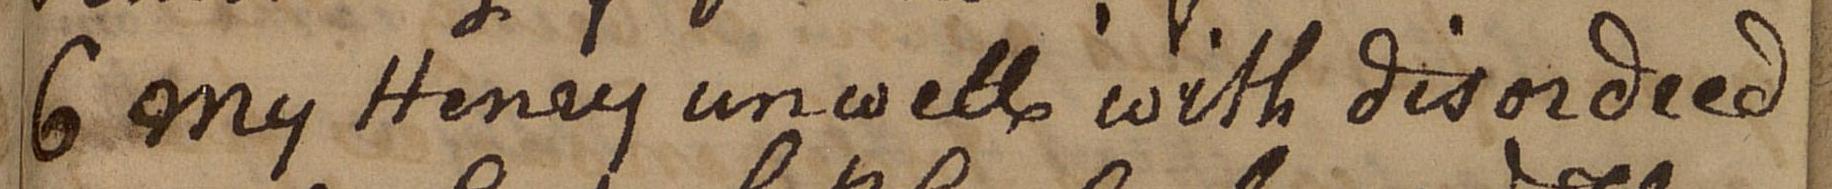6 my Henry unwell with disordeed
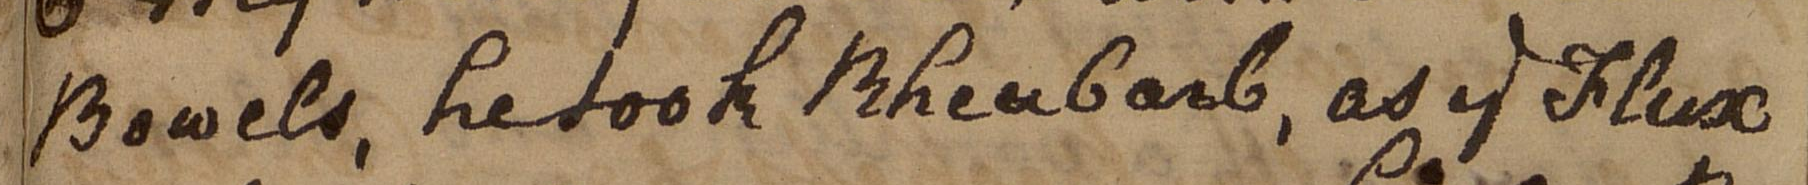Bowels, he took Rheubarb, as y^e Flux
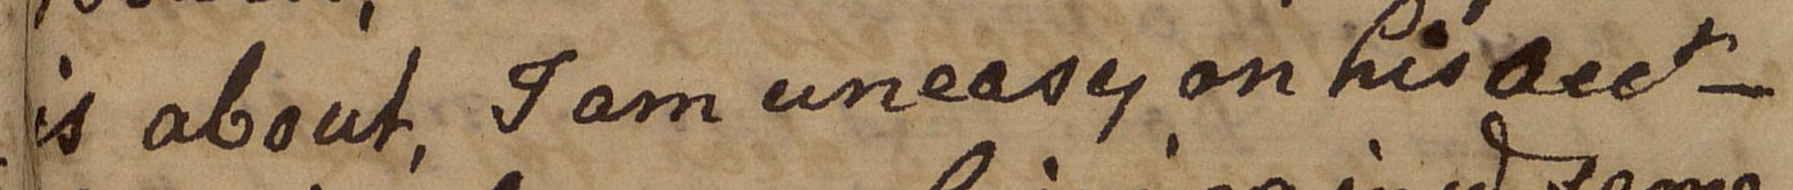is about, I am uneasy on his acc^t-
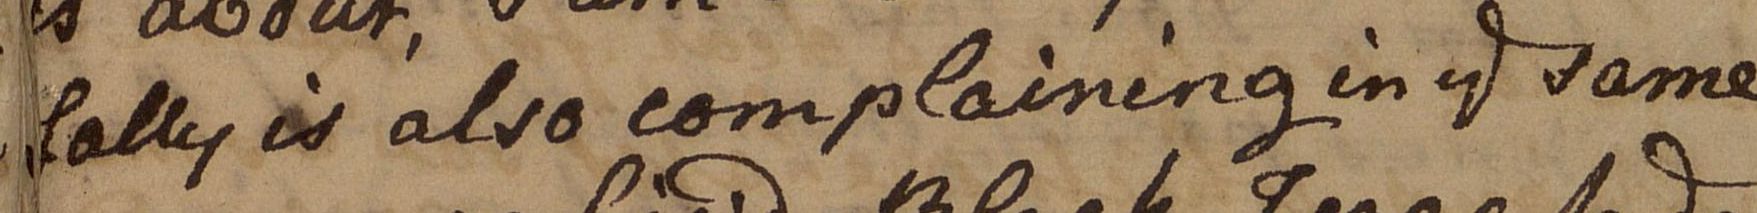Sally is also complaining in y^e same
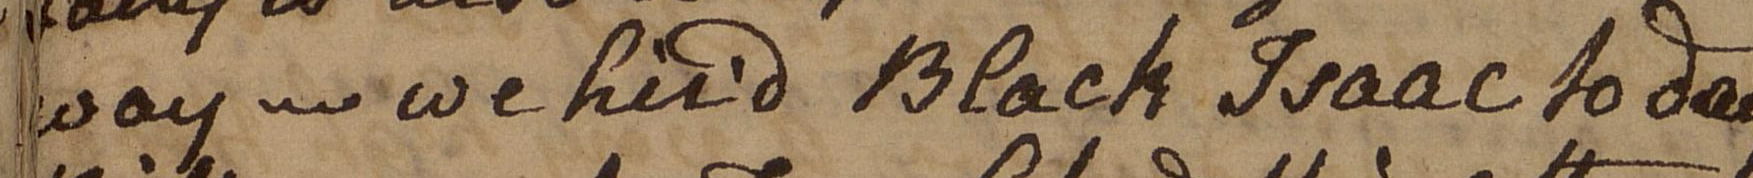way- we hir'd Black Isaac to day
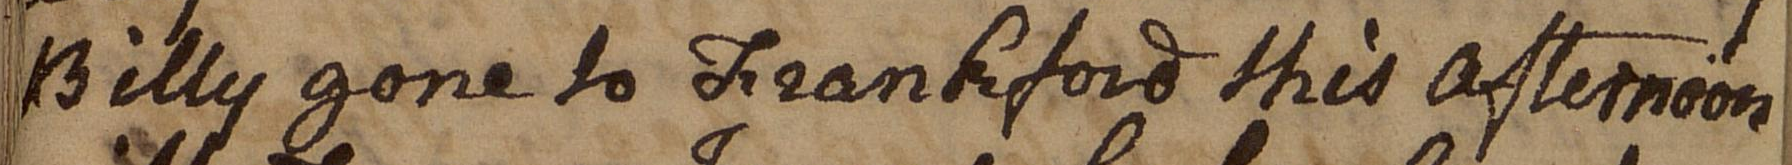Billy gone to Frankford this Afternoon
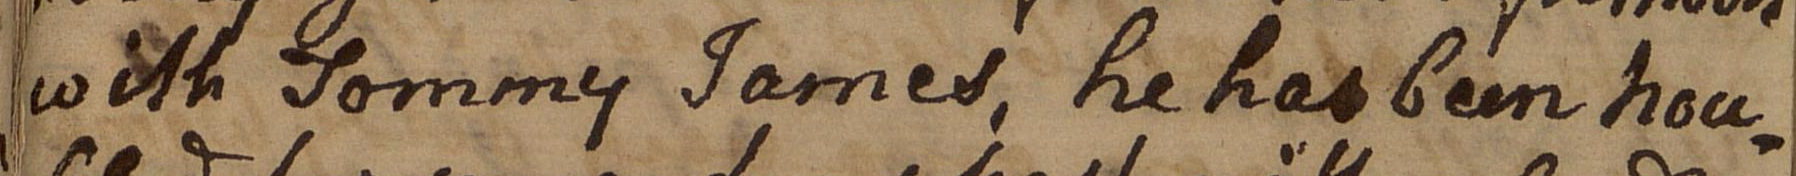with Tommy James, he has been trou-
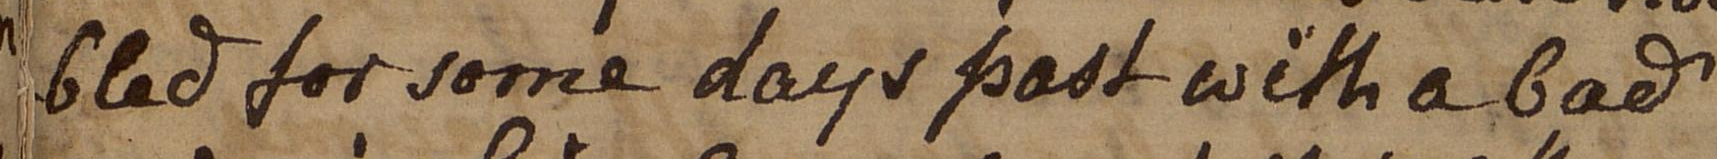-bled for some days past with a bad
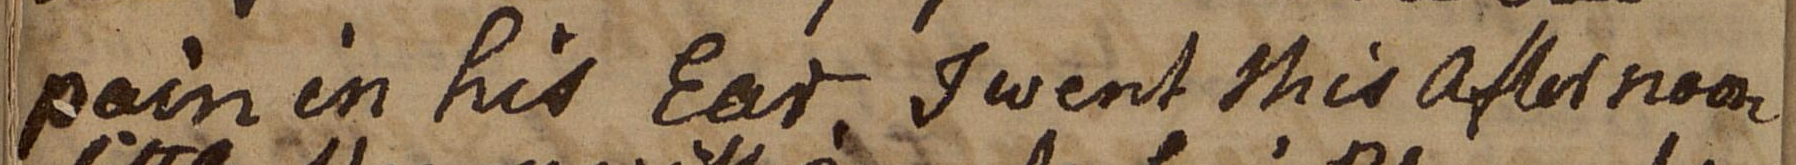pain in his Ear, I went this Afternoon
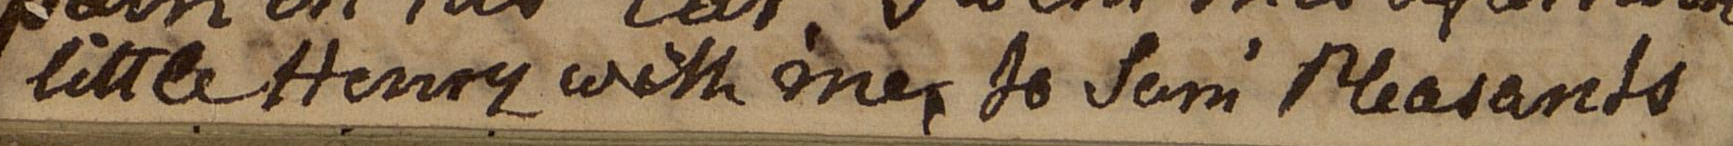little Henry with me, to Sam Pleasants
